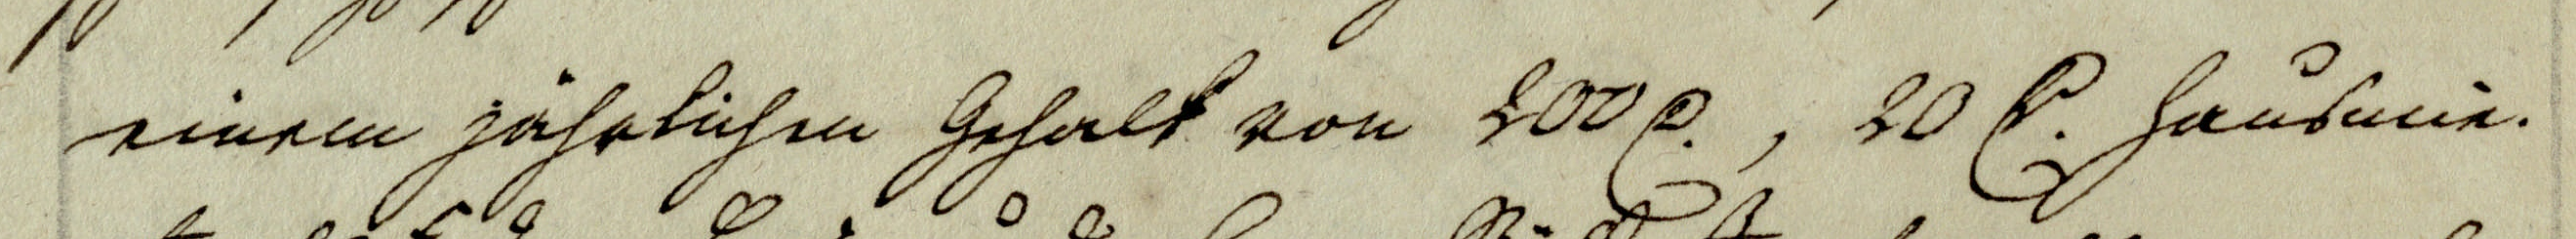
einem jährlichen Gehalt von 200 l., 20 l. Hausmie¬
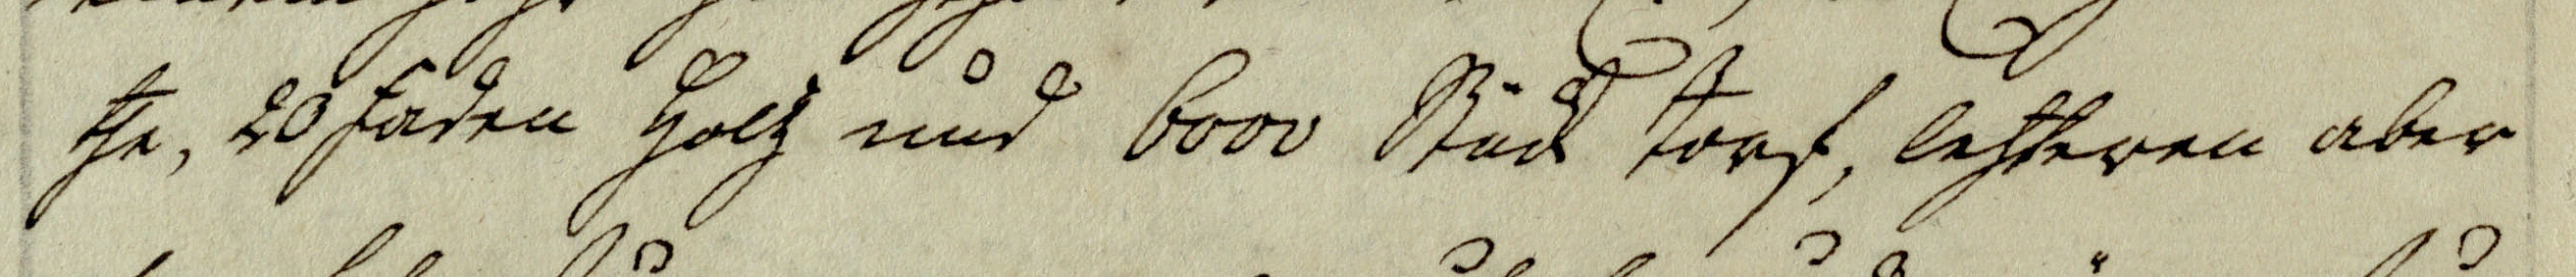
the, 20 Faden Holz und 6000 Stück Torf, letzteren aber
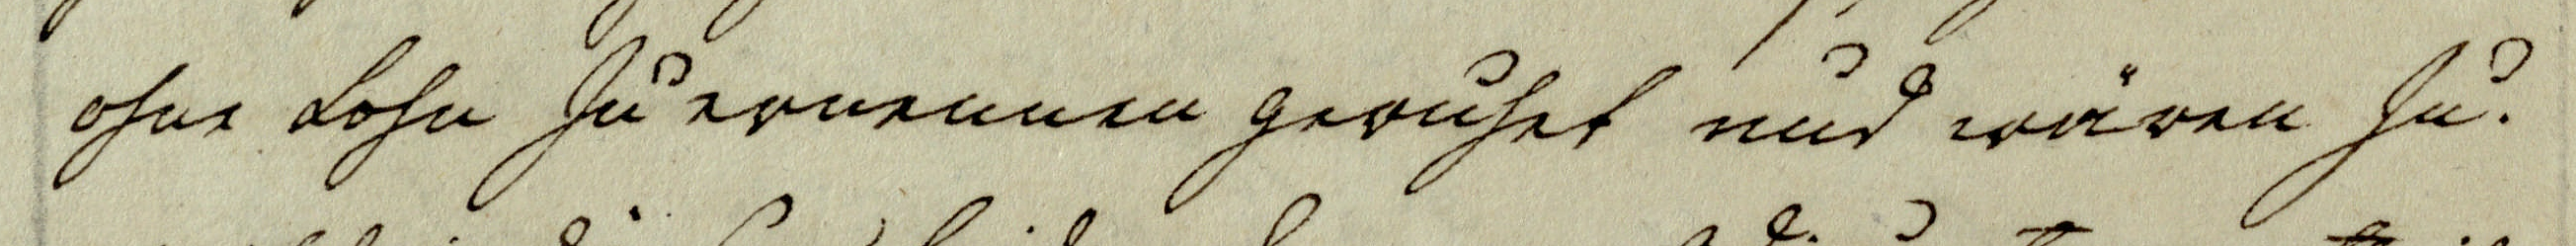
ohne Lohn zu ernennen geruhet und wären zu¬
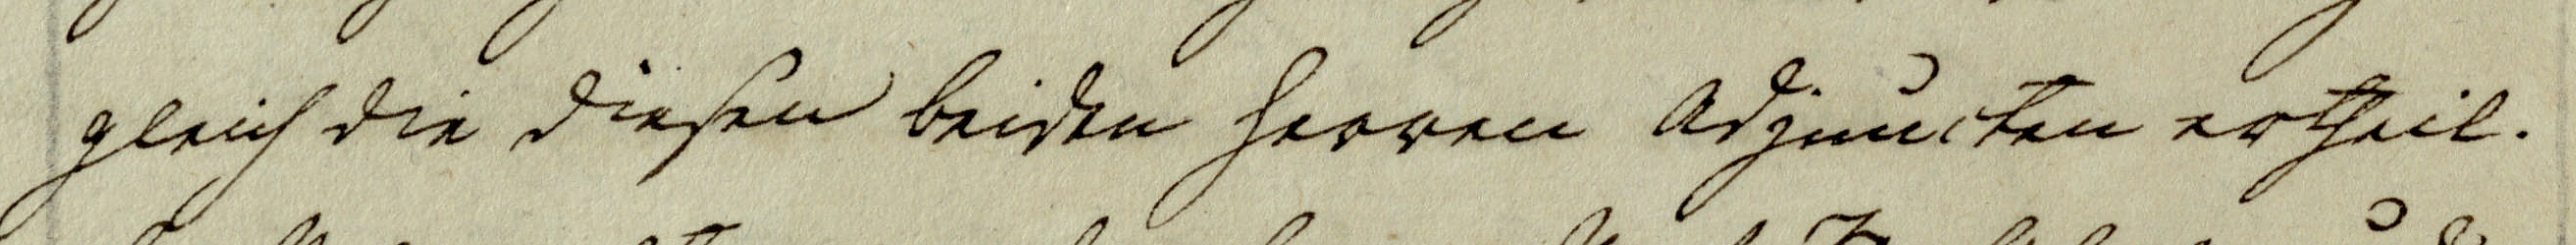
gleich die diesen beiden Herren Adjuncten ertheil¬
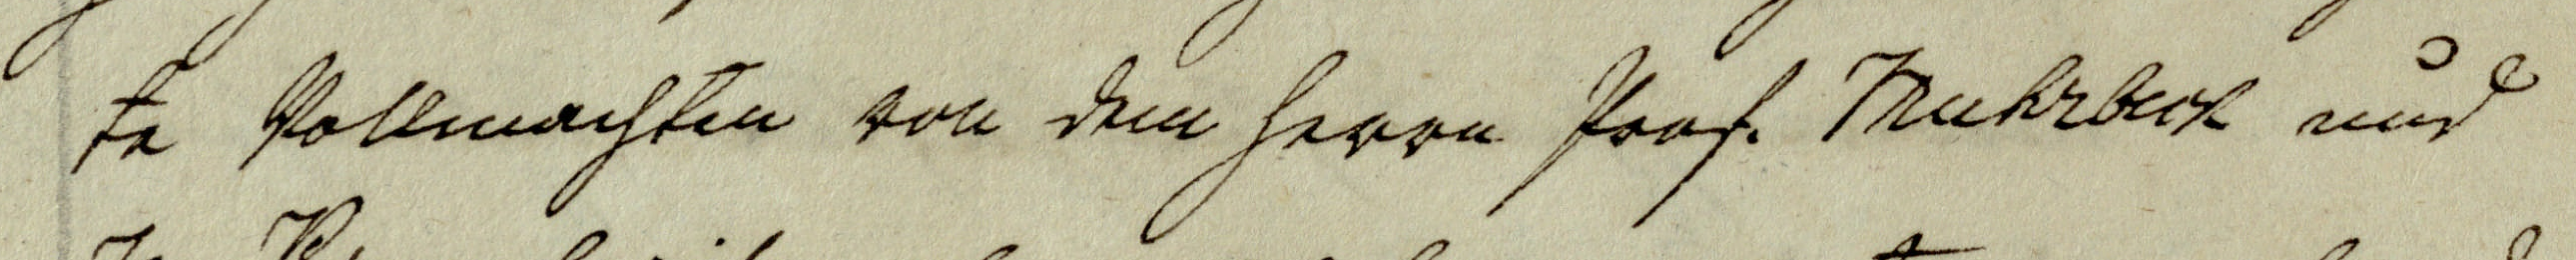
te Vollmachten von dem Herrn Prof. Muhrbeck und
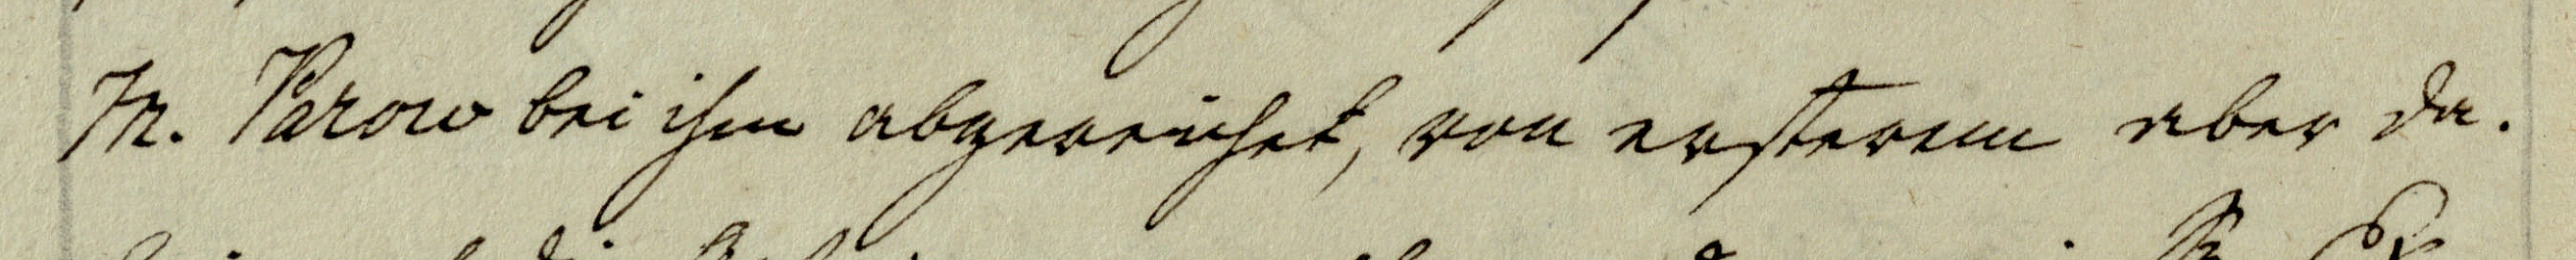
M. Parow bei ihm abgereichet, von ersterem aber da¬
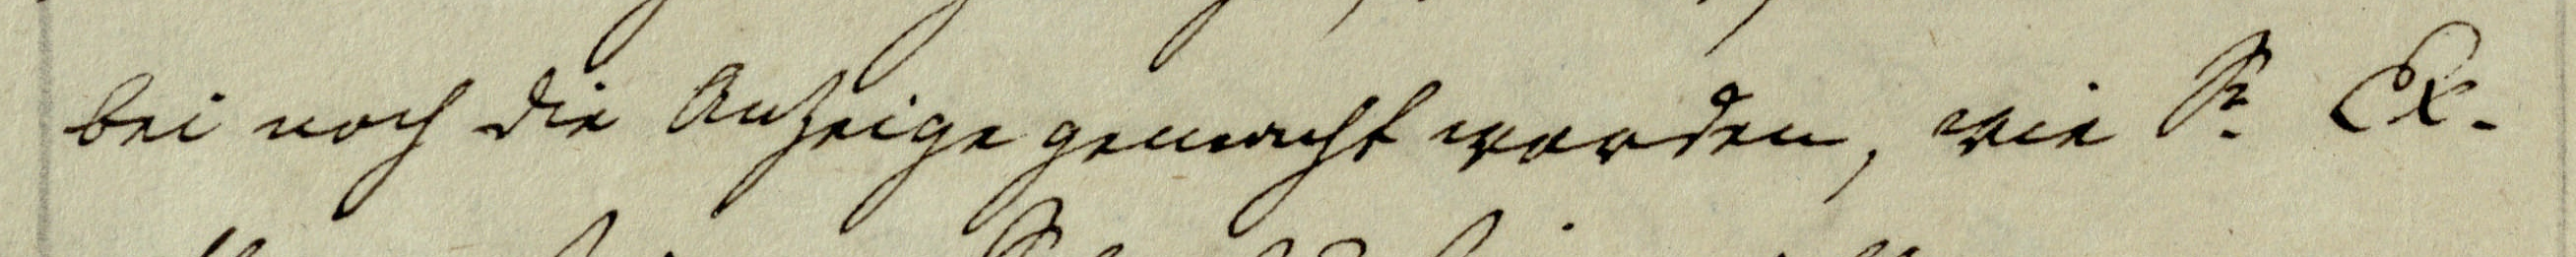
bei noch die Anzeige gemacht worden, wie Sr. Ex¬
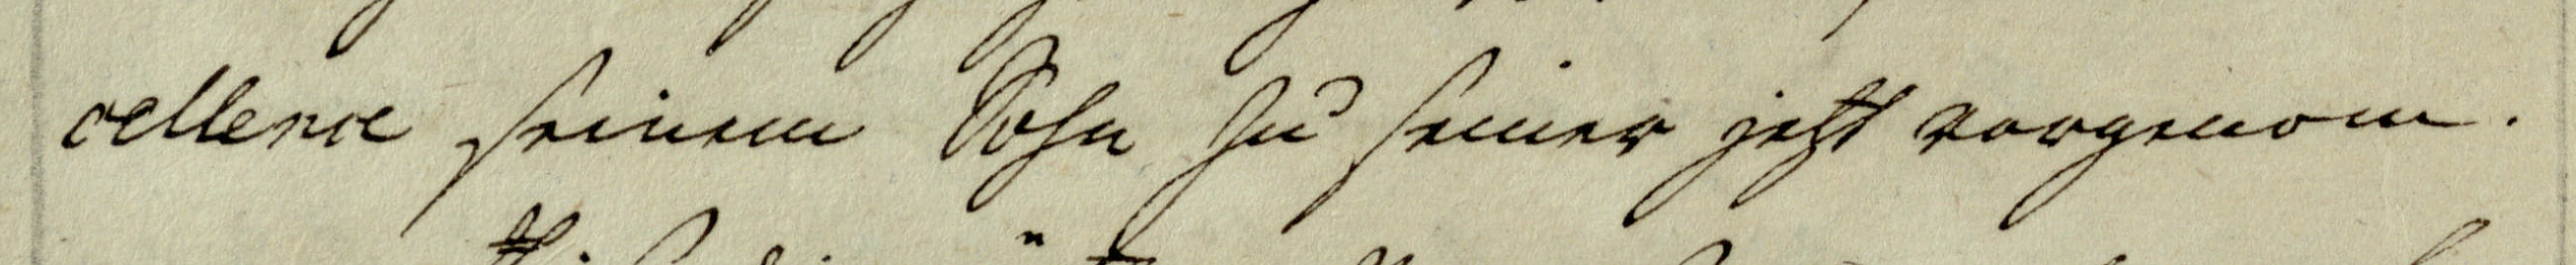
cellence seinem Sohn zu seiner jetzt vorgenom¬
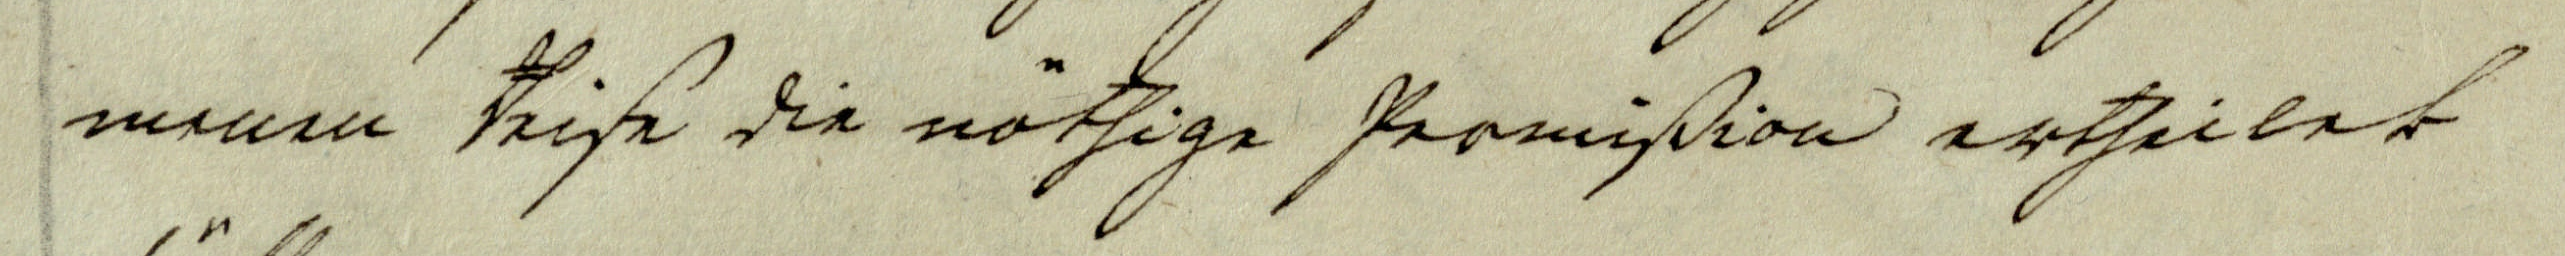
menen Reise die nöthige Permißion ertheilet
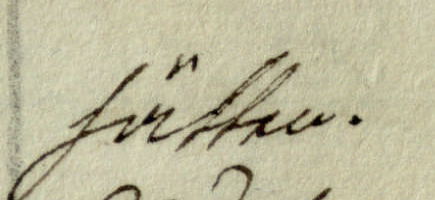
hätten.
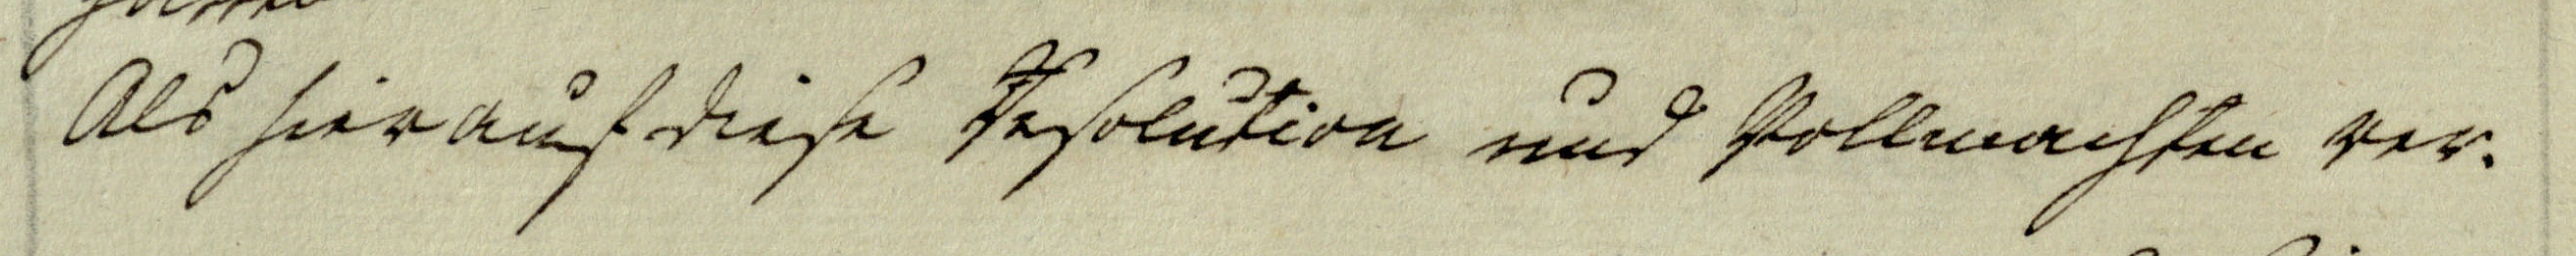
Als hierauf diese Resolution und Vollmachten ver¬
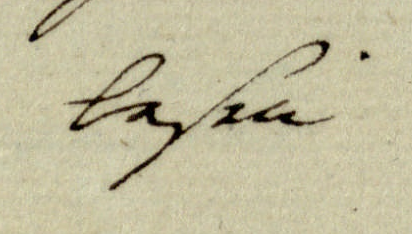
lesen
